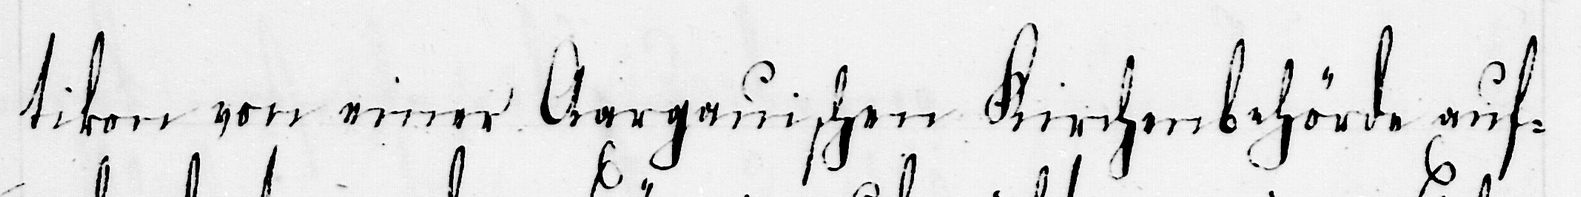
tikon von einer Aargauischen Kirchenbehörde auf¬
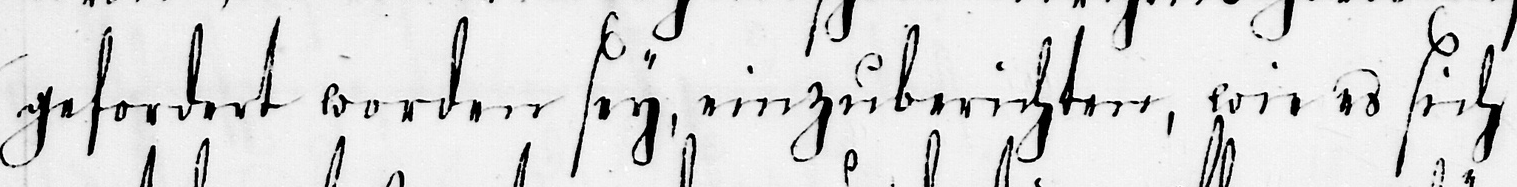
gefordert worden sey, einzuberichten, wie es sich
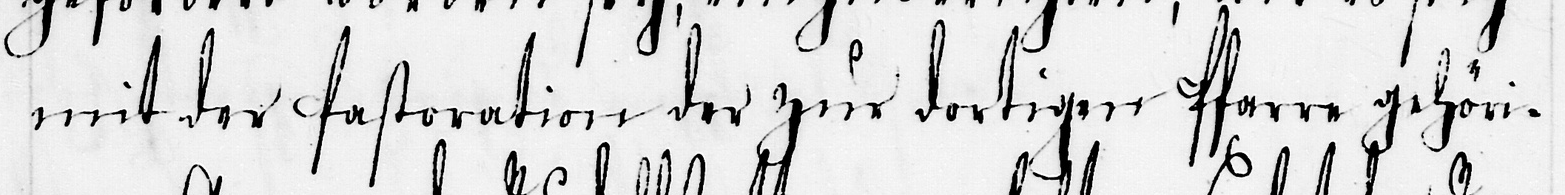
mit der Pastoration der zur dortigen Pfarre gehöri¬
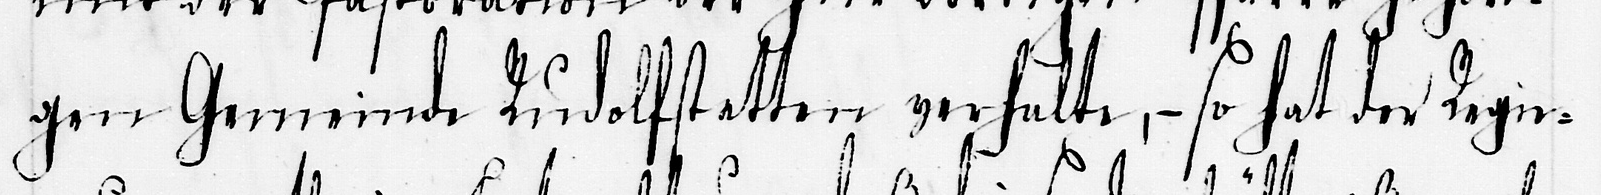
gen Gemeinde Rudolfstetten verhalte, – so hat der Regi¬
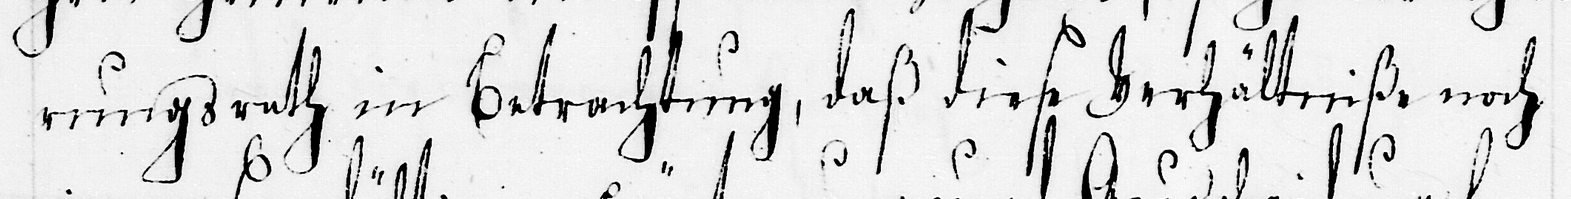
erungsrath in Betrachtung, daß diese Verhältniße noch
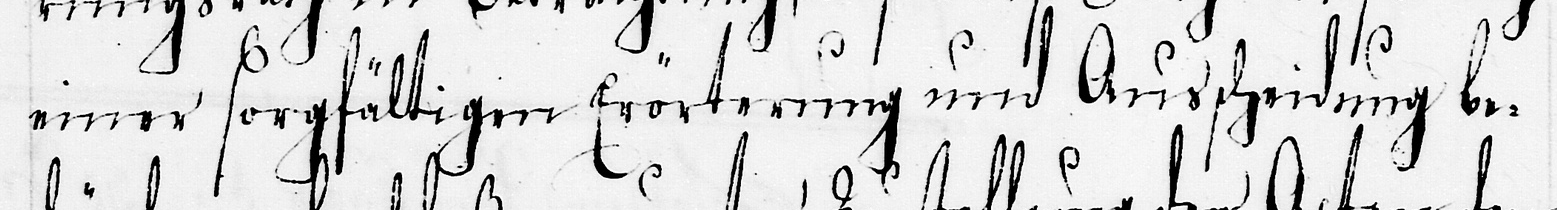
einer sorgfältigen Erörterung und Ausscheidung be¬
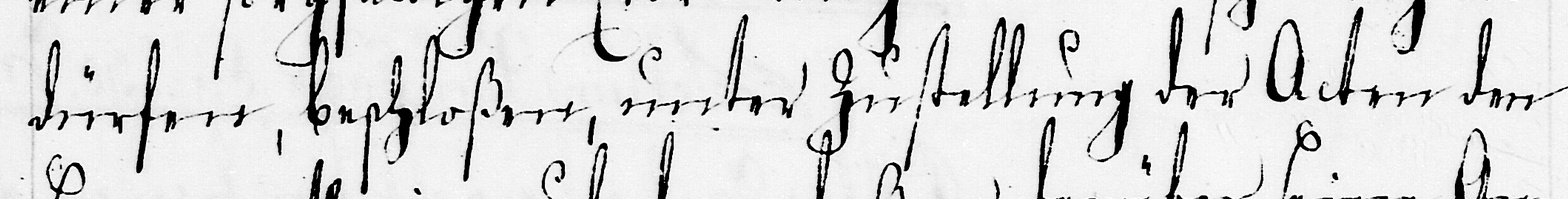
dürfen, beschloßen, unter Zustellung der Acten den
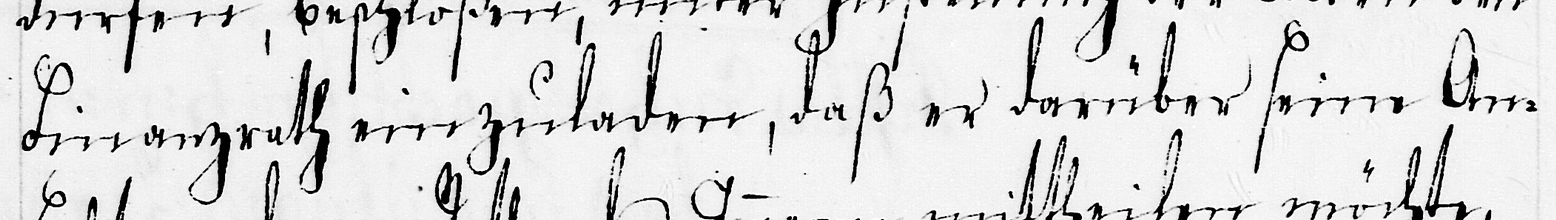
Finanzrath einzuladen, daß er darüber seine An¬
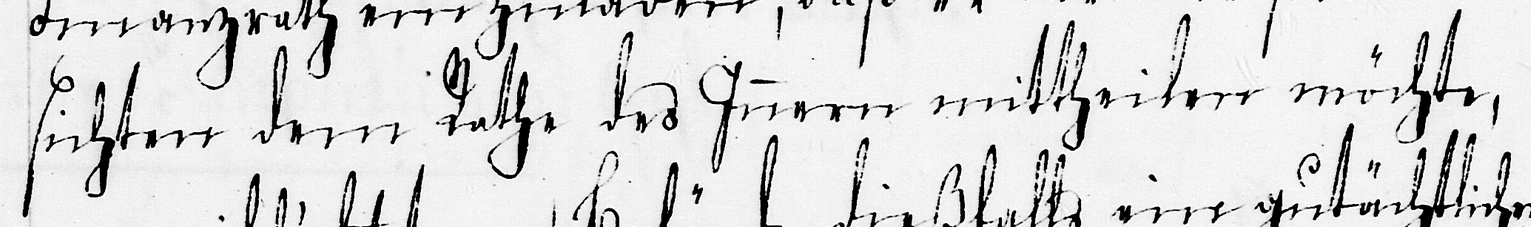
sichten dem Rathe des Innern mittheilen möchte,
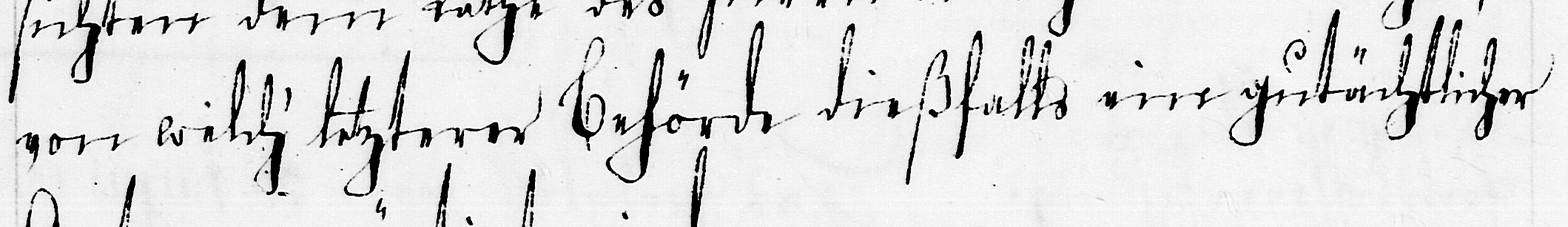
von welch‘ letzterer Behörde dießfalls ein gutächtlicher
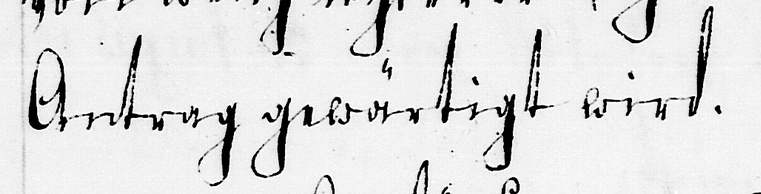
Antrag gewärtigt wird.
